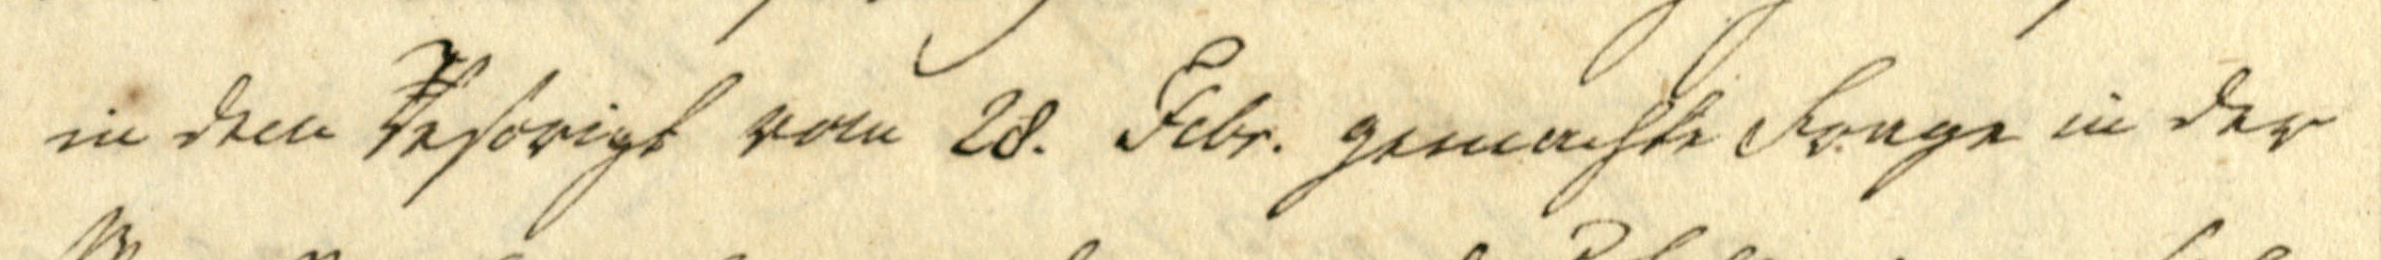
in dem Rescript vom 20. Febr. gemachte Frage in der
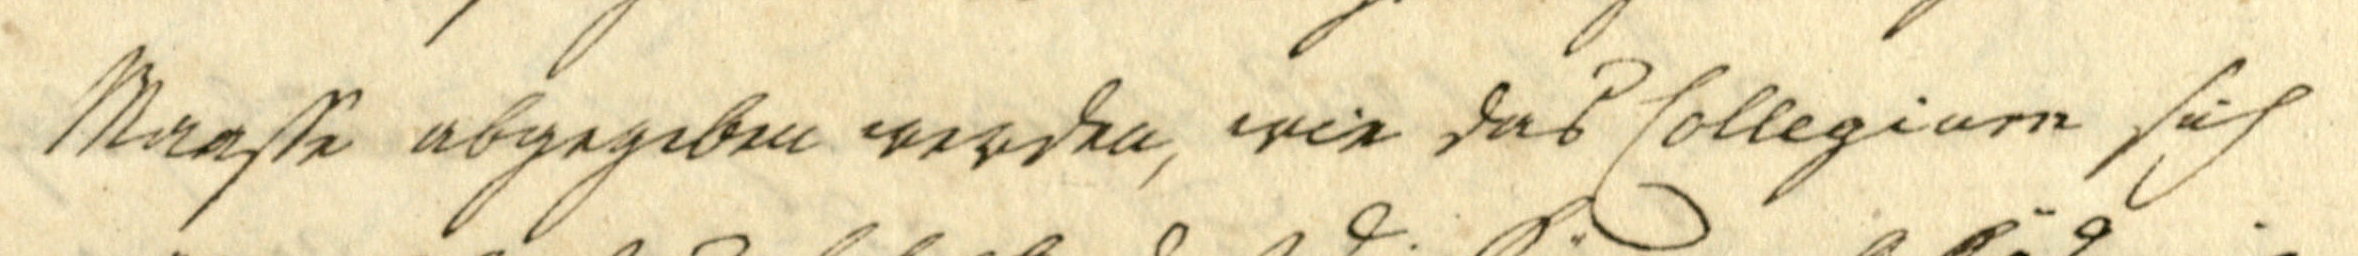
Maasse abgegeben werden, wie das Collegium sich
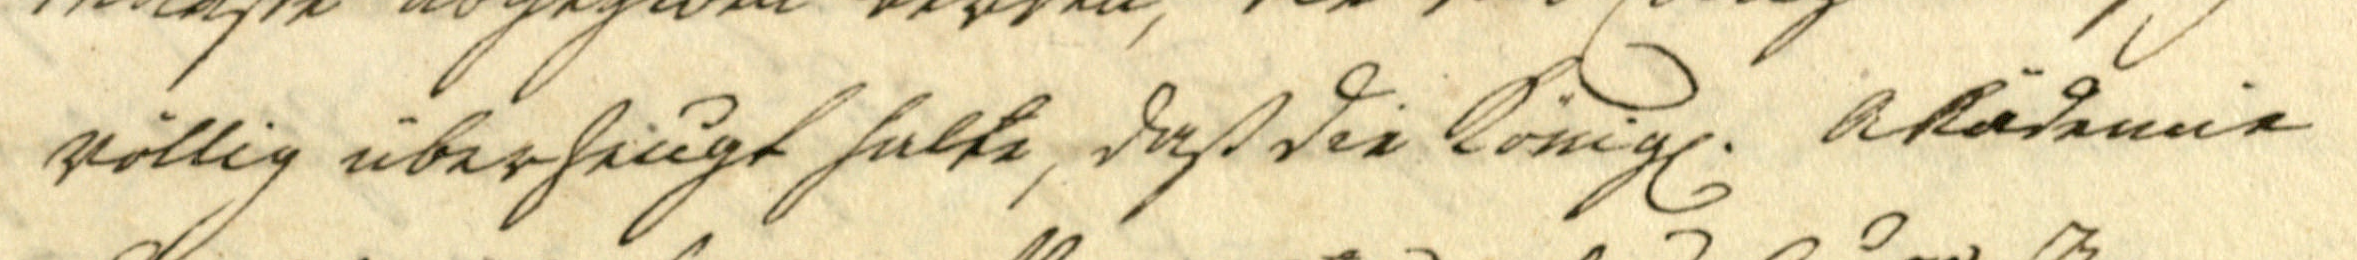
völlig überzeugt halte, daß die Königl. Akademie
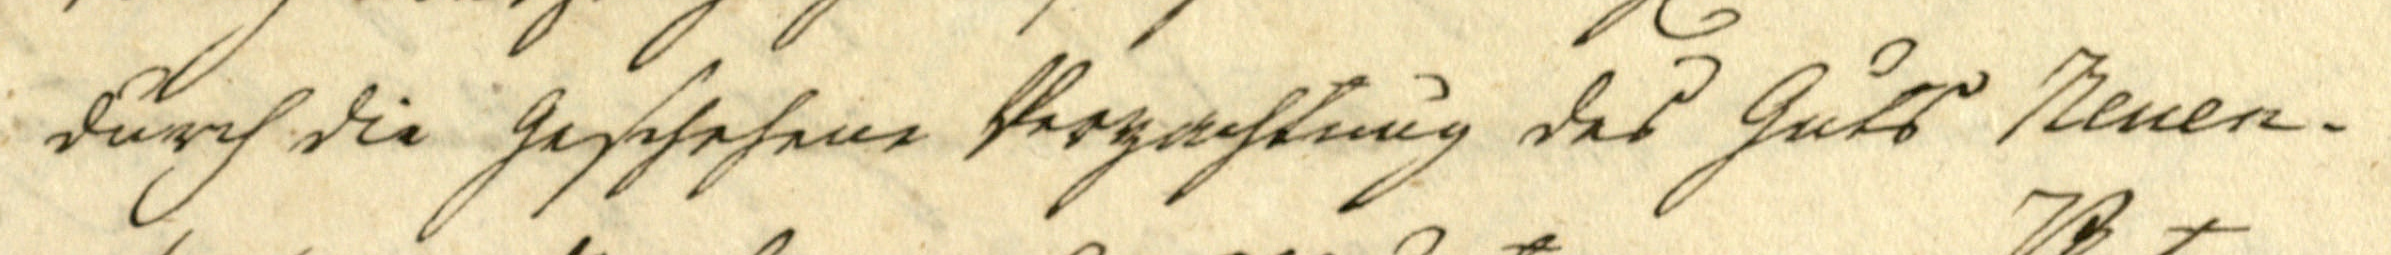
durch die geschehene Verpachtung des Guts Neuen¬
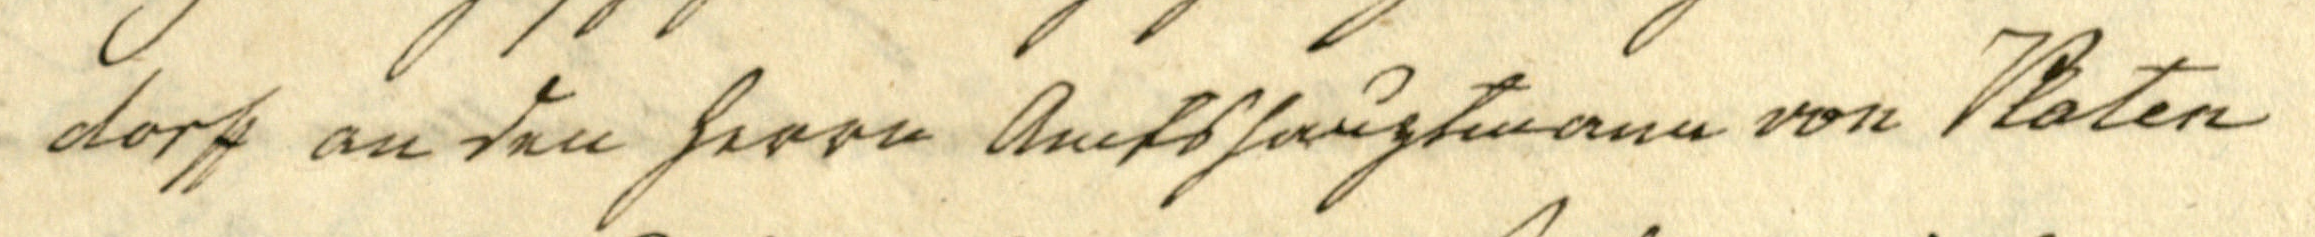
dorff an den Herrn Amtshauptmann von Platen
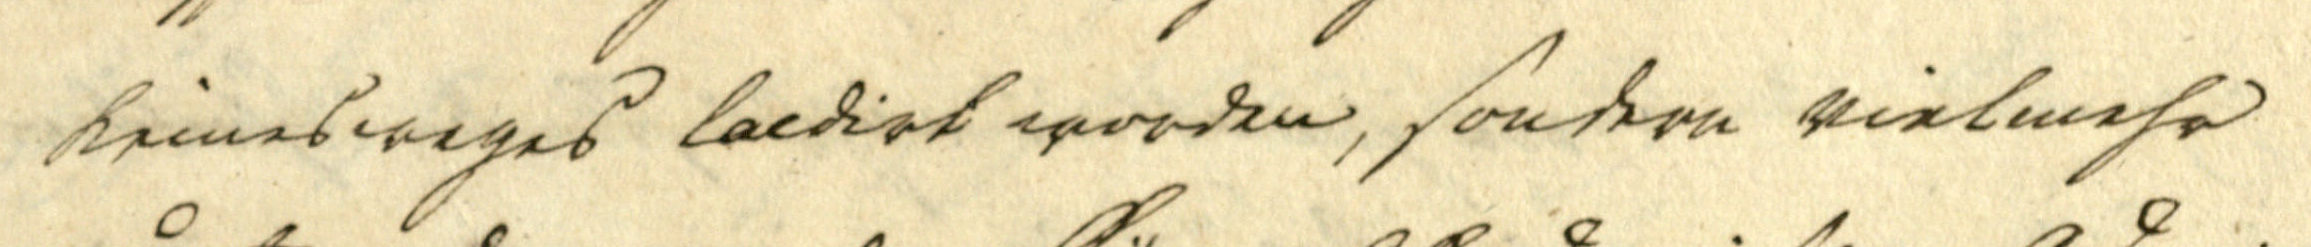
keinesweges laedirt worden, sondern vielmehr
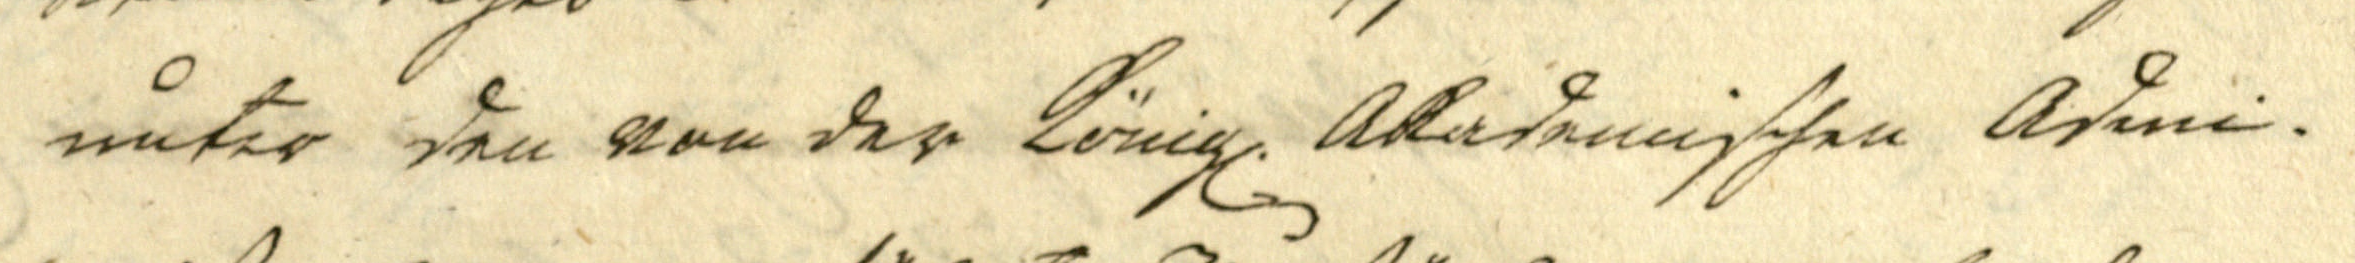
unter den von der Königl. Akademischen Admi¬
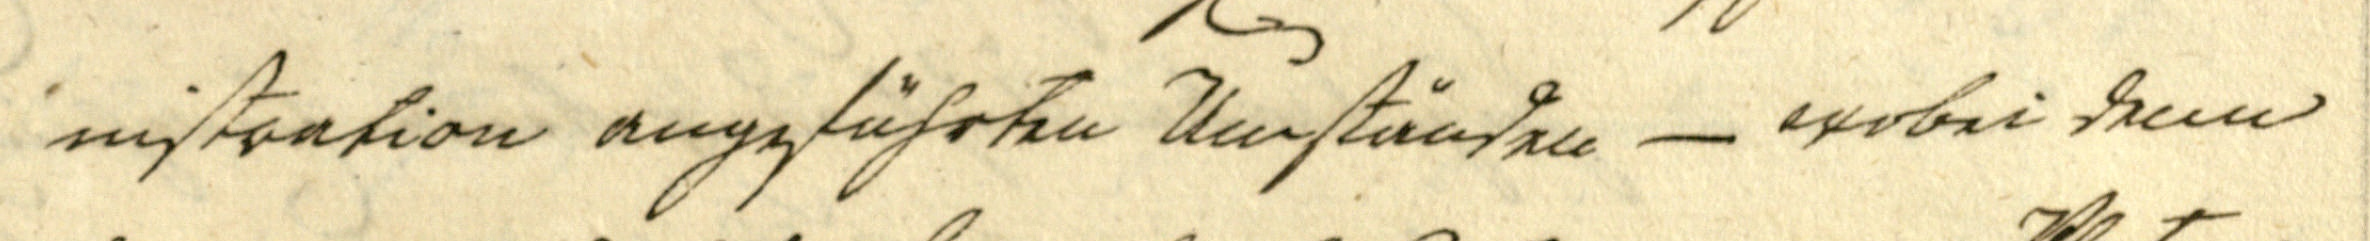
nistration angeführten Umständen - wobei denn
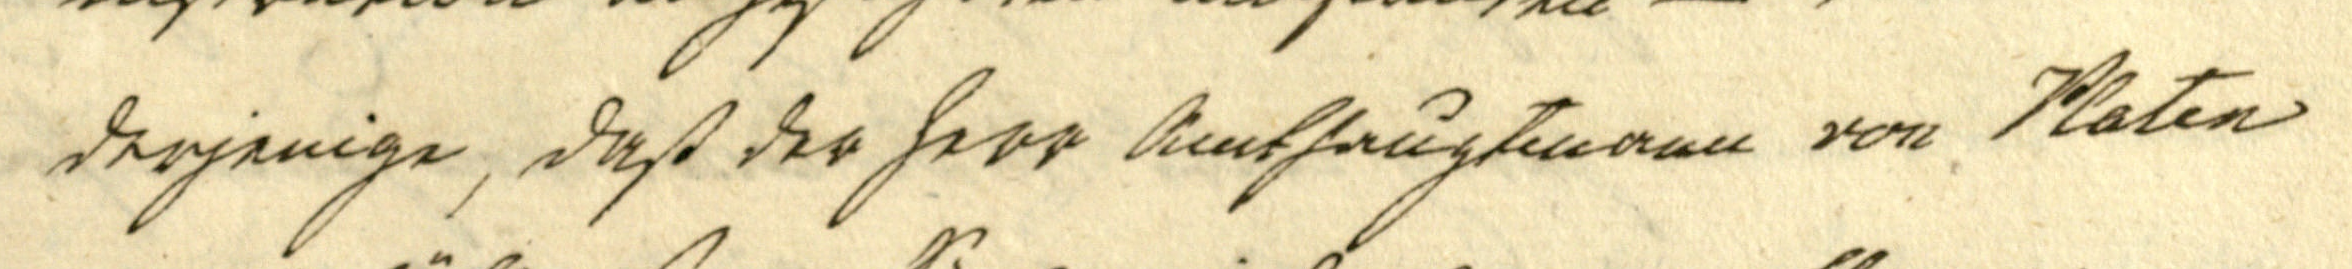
derjenige, daß der Herr Amthauptmann von Platen
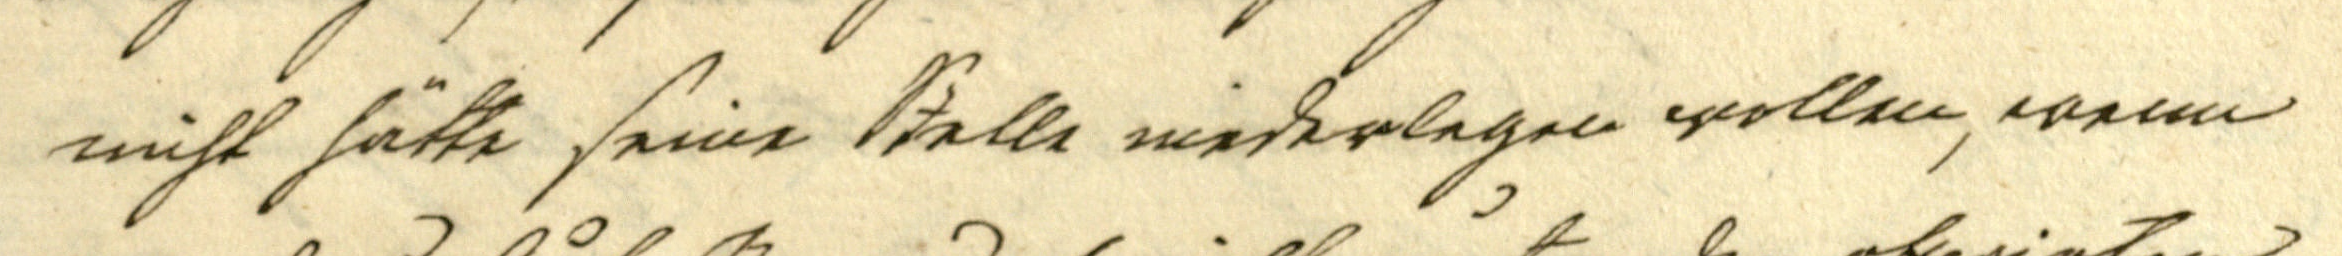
nicht hätte seine Stelle niederlegen wollen, wenn
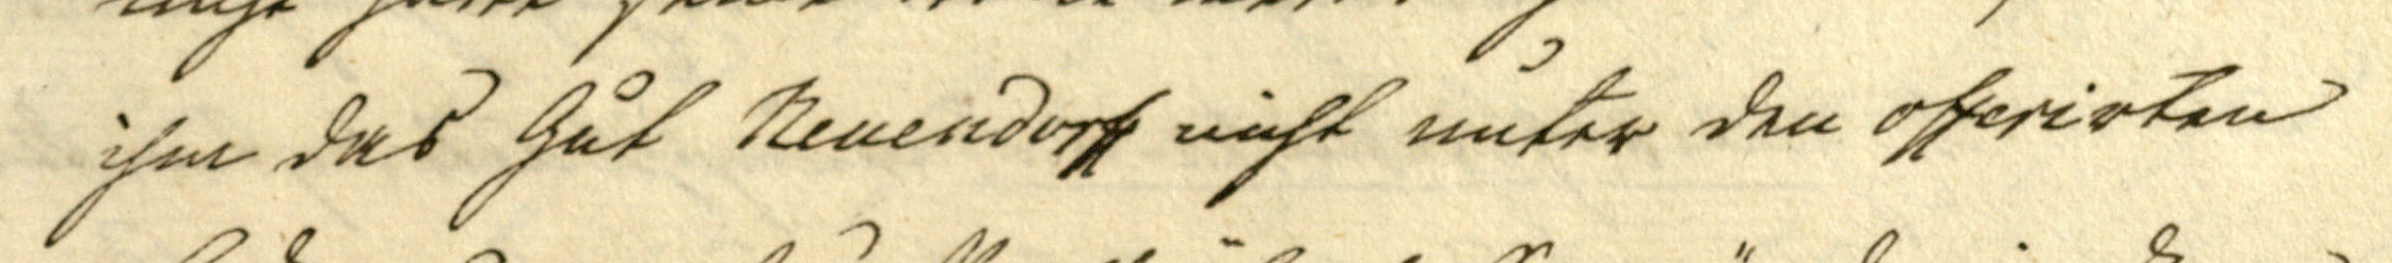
ihm das gut Neuendorff nicht unter den offerirten
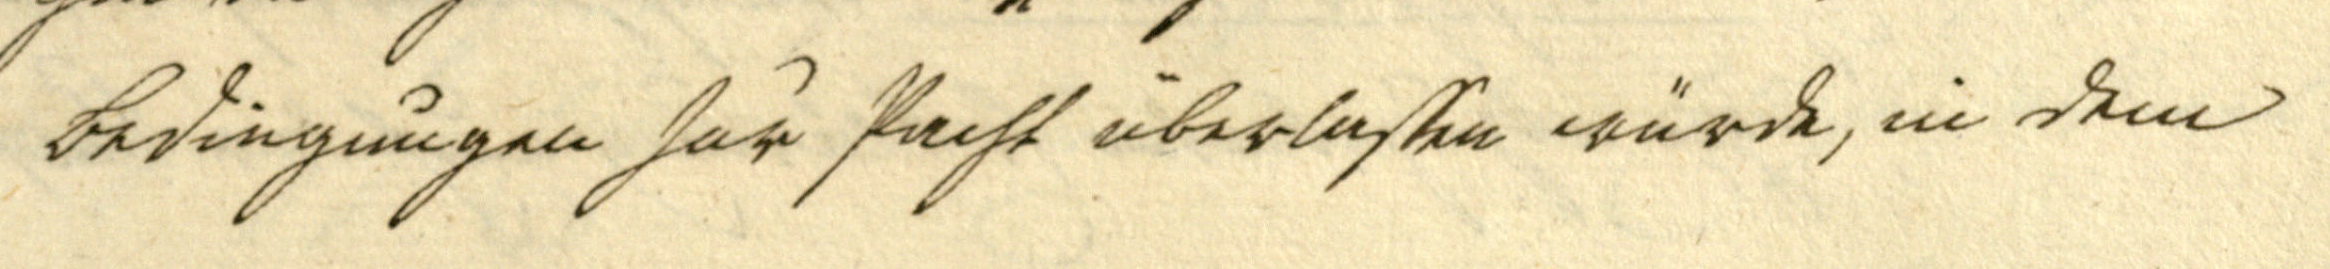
Bedingungen zur Pacht überlassen würde, in dem
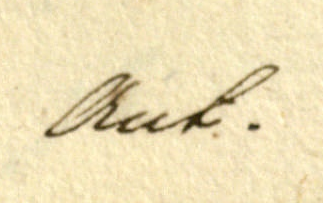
Ant
